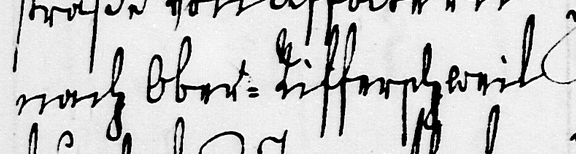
nach Ober-Rifferschweil,
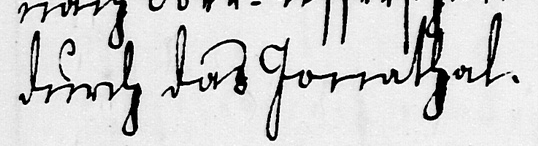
durch das Jonathal
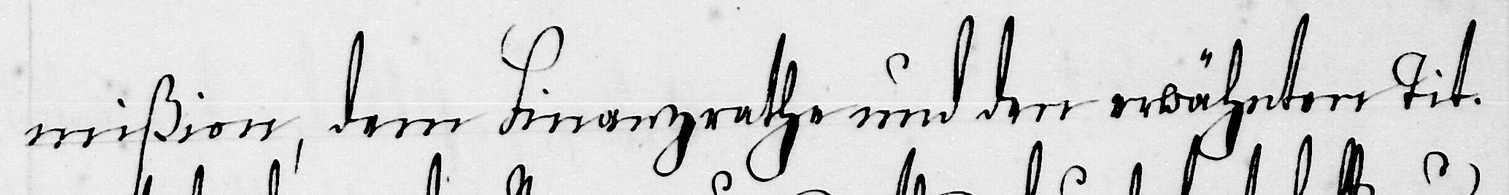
mißion, dem Finanzrathe und den erwähnten Tit.
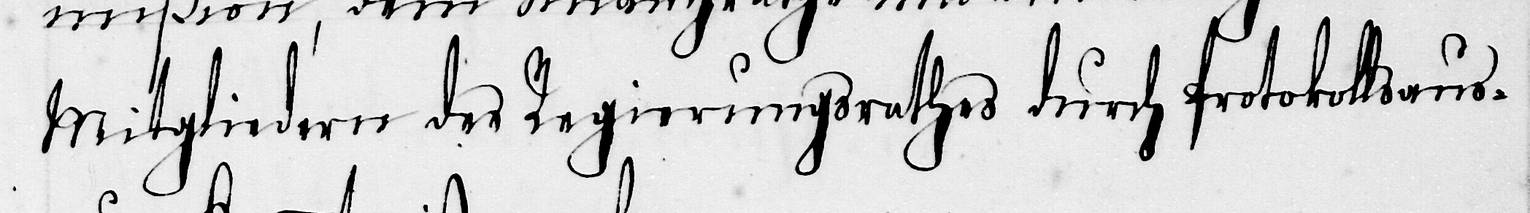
Mitgliedern des Regierungsrathes durch Protokollsaus¬
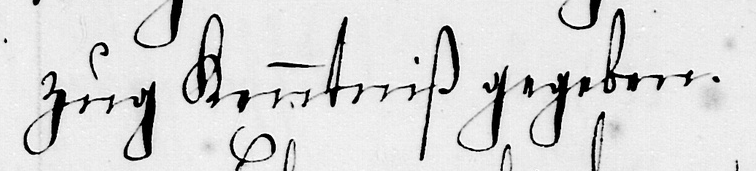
zug Kenntniß gegeben.
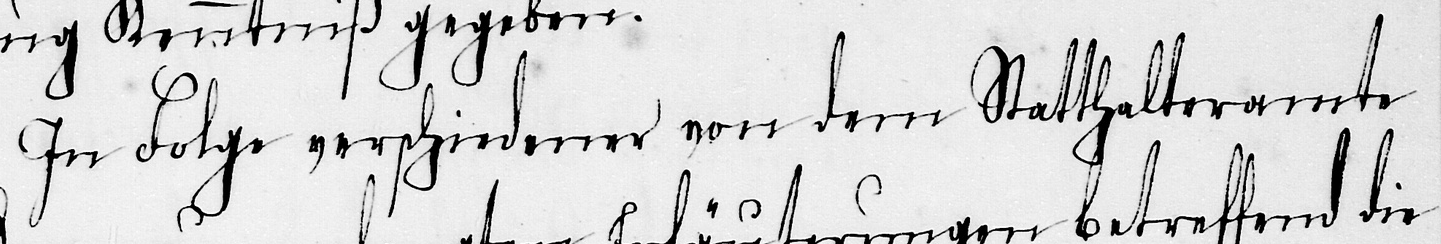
In Folge verschiedener von dem Statthalteramte
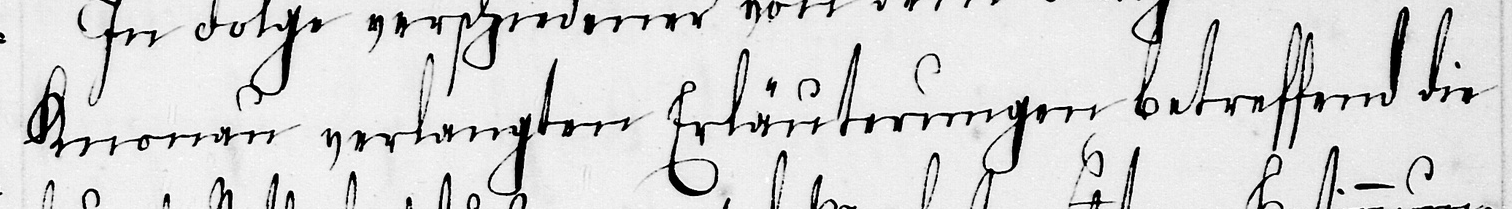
Knonau verlangten Erläuterungen betreffend die
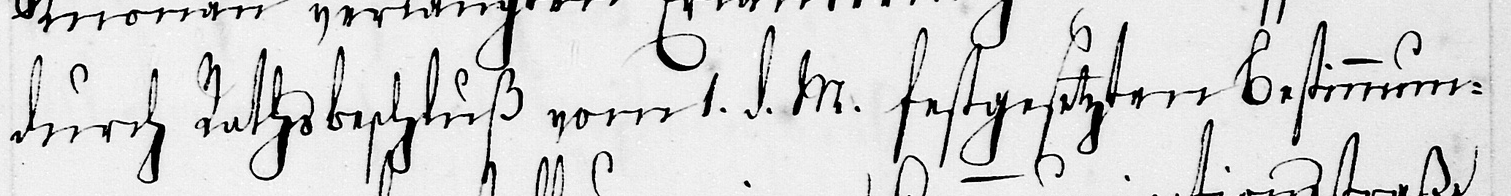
durch Rathsbeschluß vom 1. d. M. festgesetzten Bestimmun¬
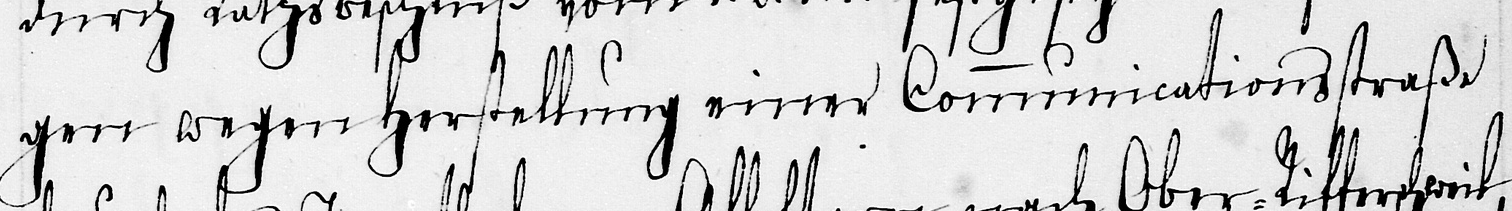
gen wegen Herstellung einer Communicationsstraße
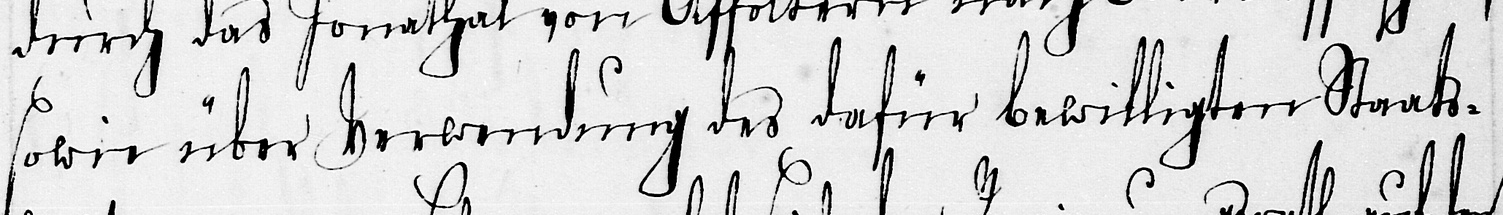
sowie über Verwendung des dafür bewilligten Staats¬
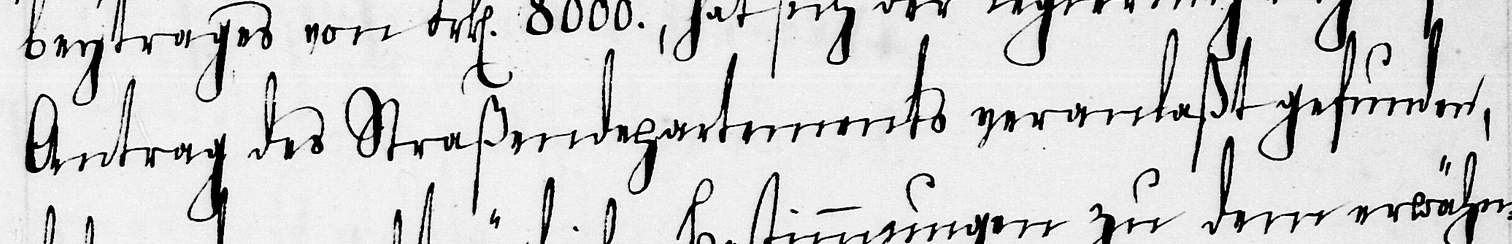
Antrag des Straßendepartements veranlaßt gefunden,
